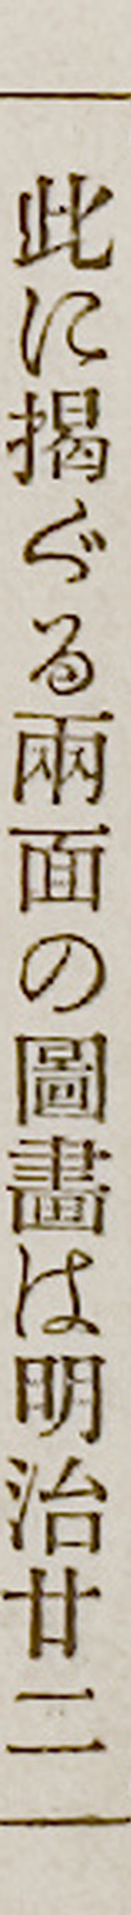此に掲ぐる両面の図画は明治廿二
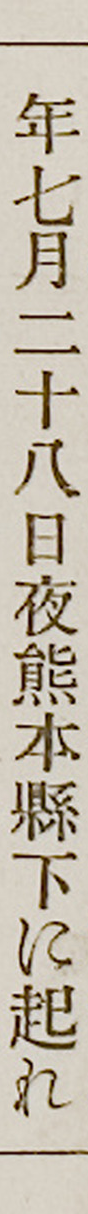年七月二十八日夜熊本県下に起れ
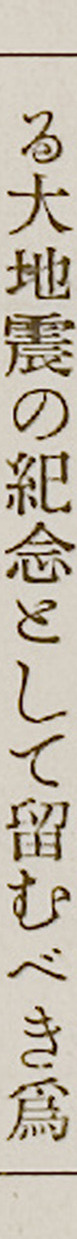る大地震の紀念として留むべき為
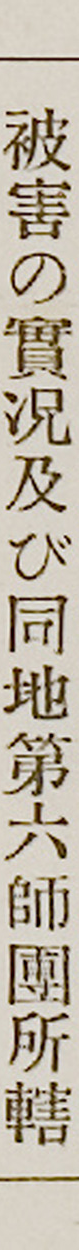被害の実況及び同地第六師団所轄
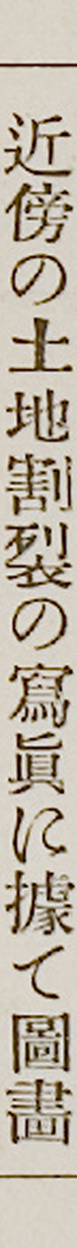近傍の土地割裂の写真に拠て図画
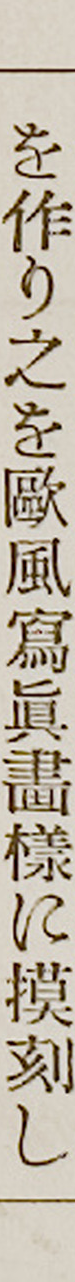を作り之を欧風写真画様に模刻し
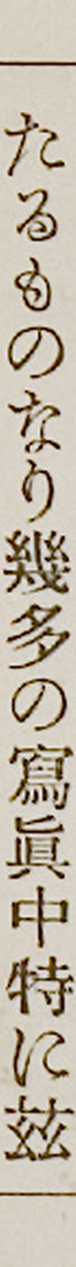たるものなり幾多の写真中特に茲
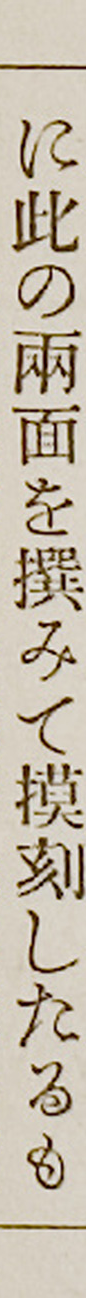に此の両面を撰みて模刻したるも
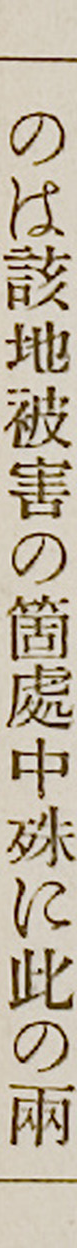のは該地被害の箇処中殊に此の両
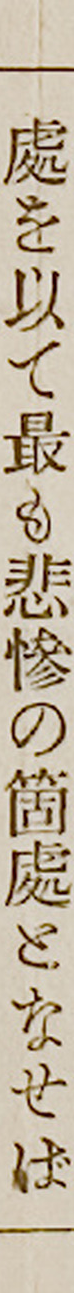処を以て最も悲惨の箇処となせば
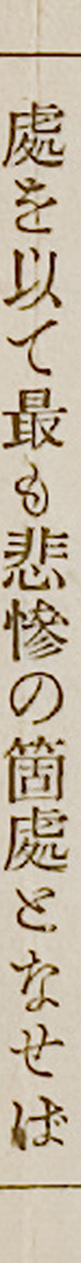処を以て最も悲惨の箇処となせば
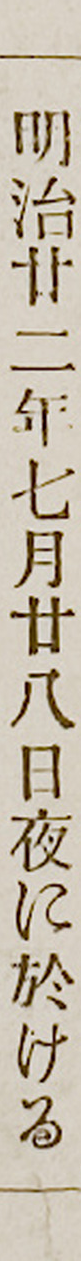明治廿二年七月廿八日夜に於ける
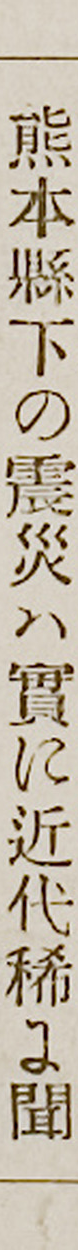熊本県下の震災は実に近代稀に聞
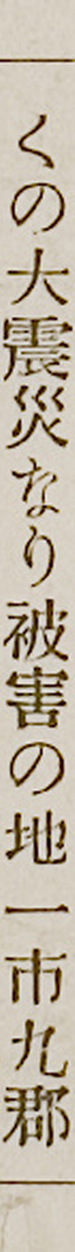くの大震災なり被害の地一市九郡
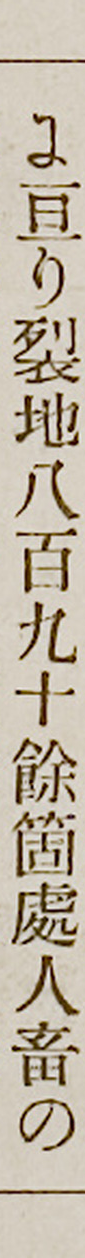に亘り裂地八百九十余箇処人畜の
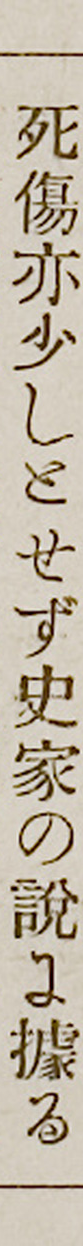死傷亦少しとせず史家の説に拠る
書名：熊本県下飽田郡高橋町市街震災被害真図
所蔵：東京大学総合図書館 General Library in the University of Tokyo, JAPAN
